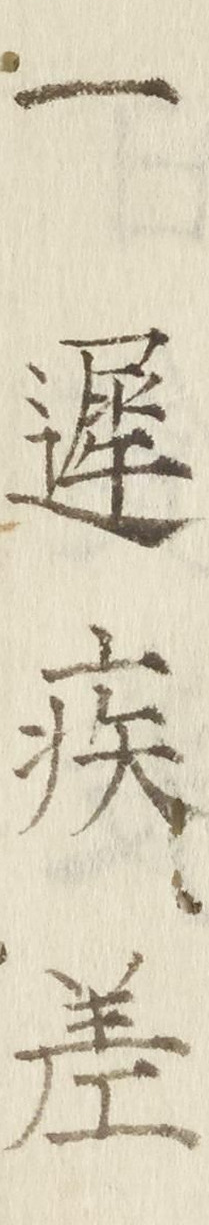一遅疾差
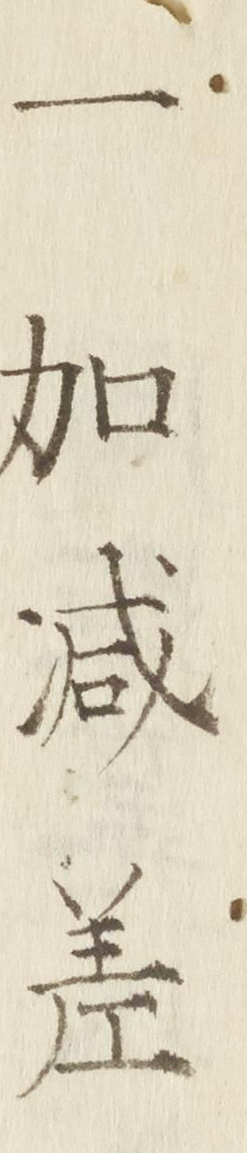一加減差
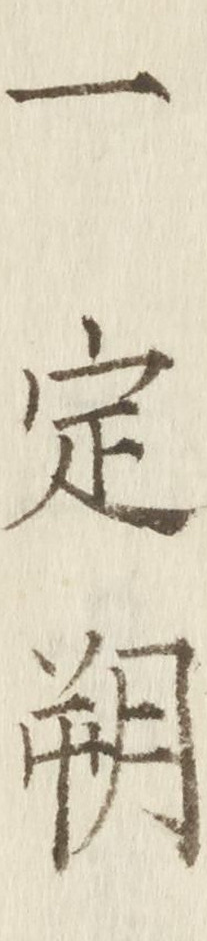一定朔
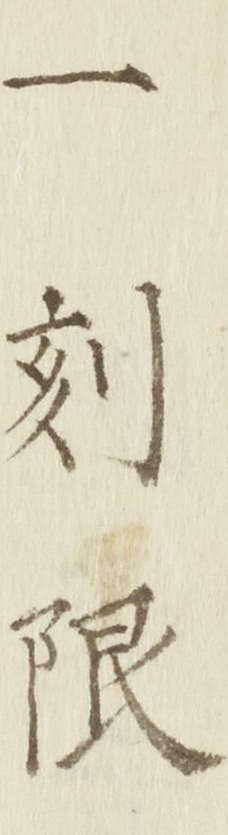一刻限
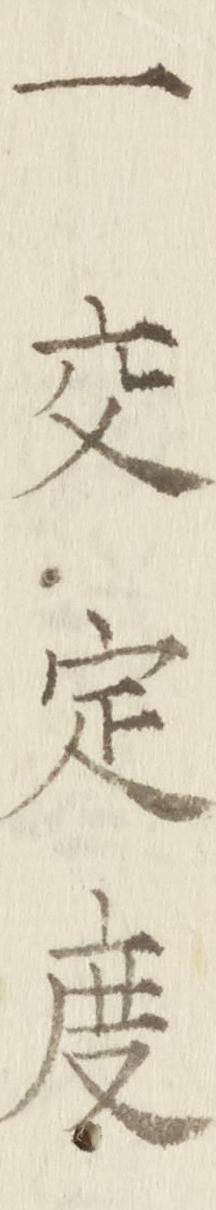一交定度
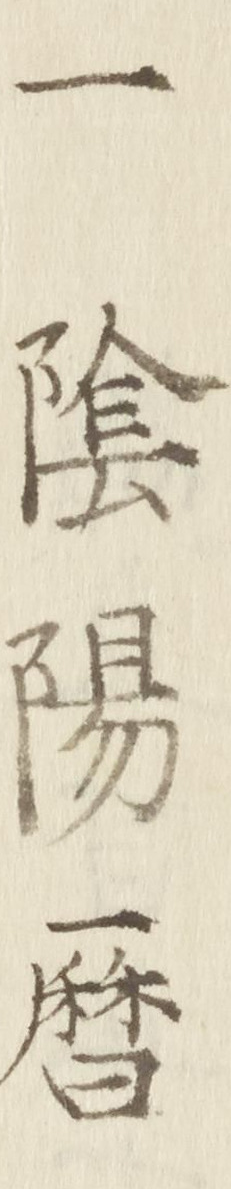一陰陽暦
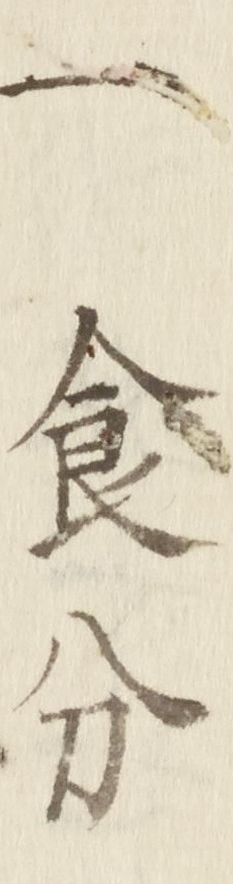一食分
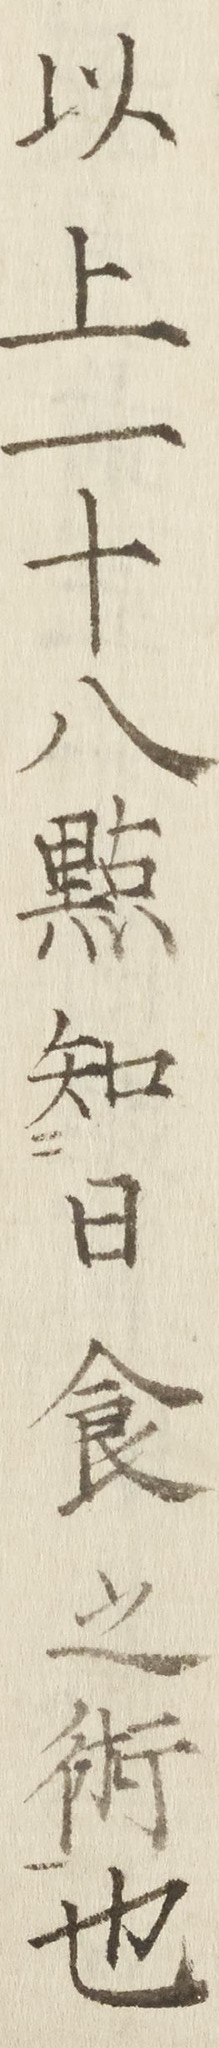以上一十八点知日食之術也

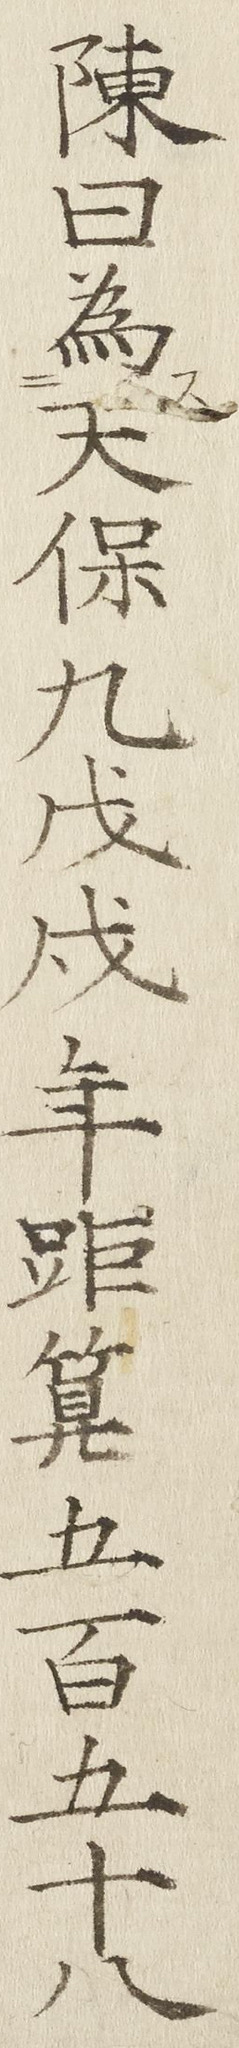陳曰天保九戊戌年距離算五百五十八
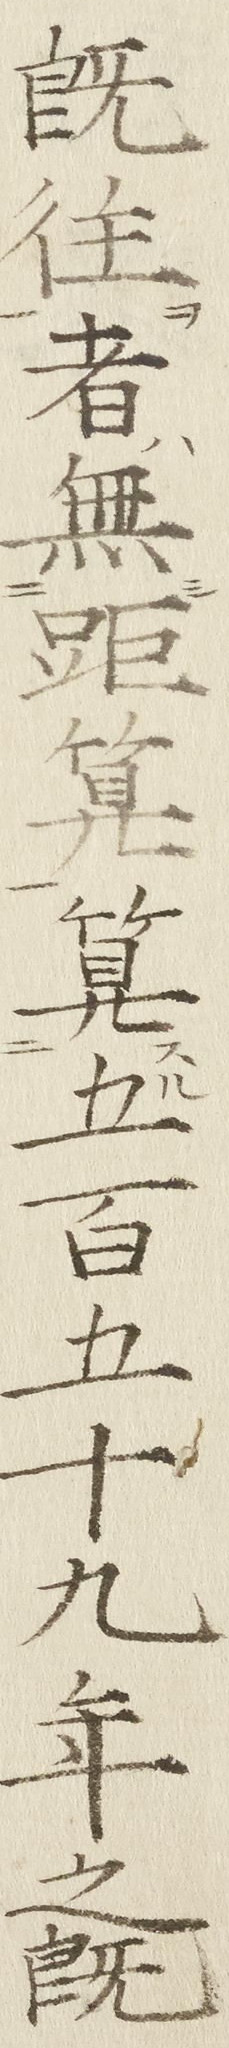既往者無距算算五百五十九年之既
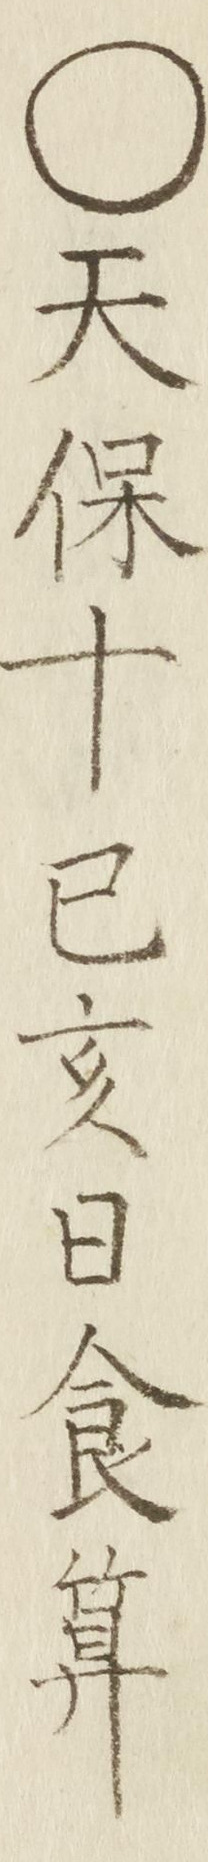○天保十己亥日食合算
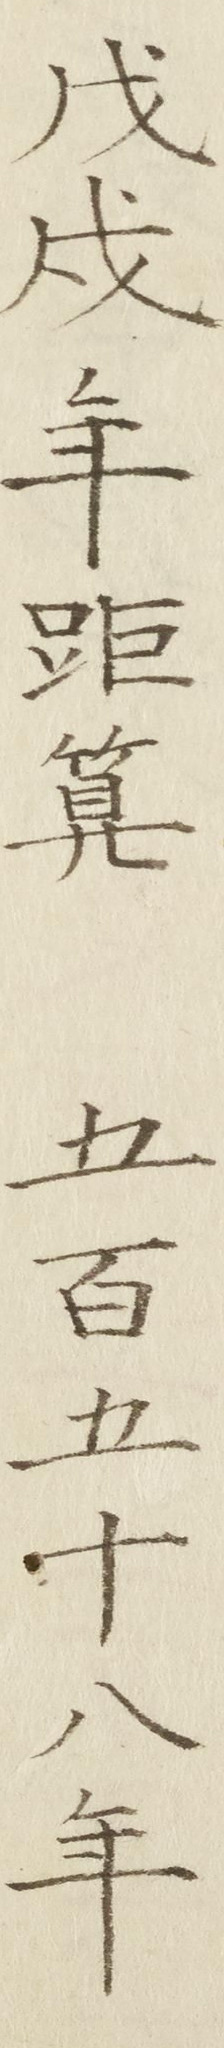戊戌年距算五百五十八年
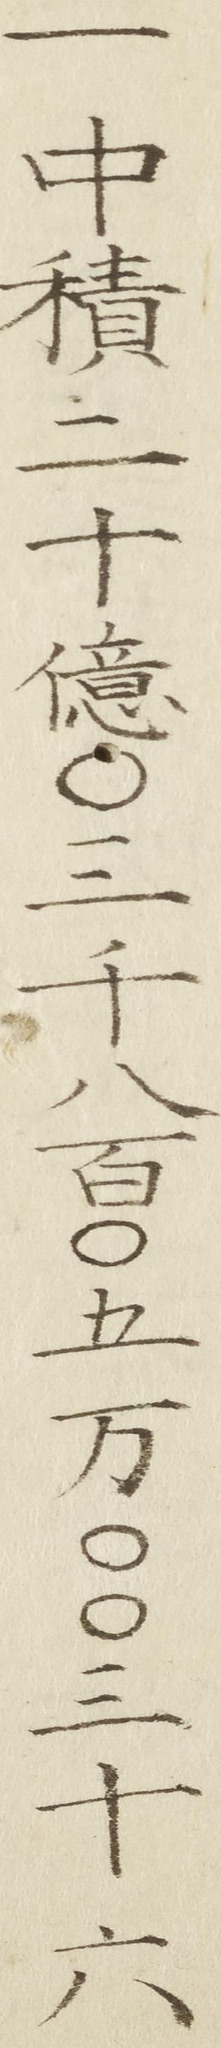一中積二十億〇三千八百〇五万〇〇三十六
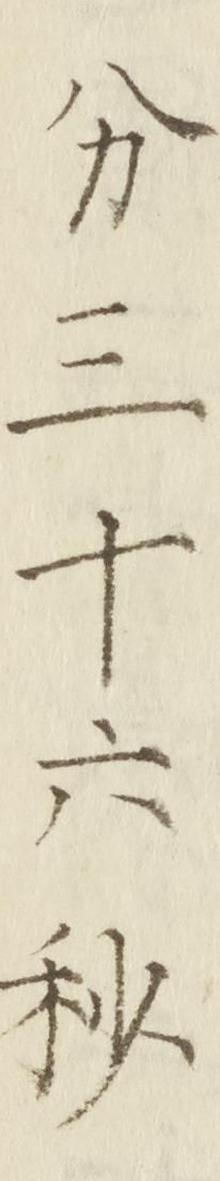分三十六秒
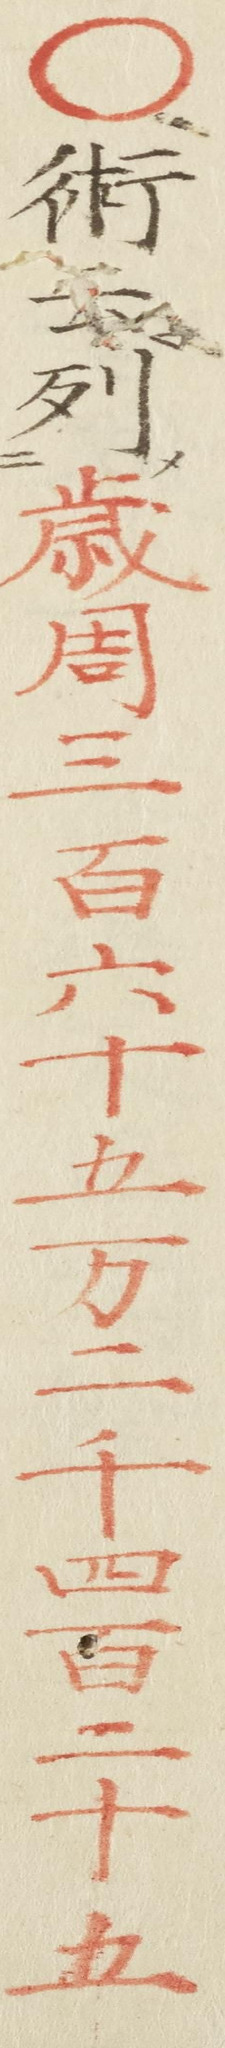○術云。列歳周三百六十五万二千四百二十五
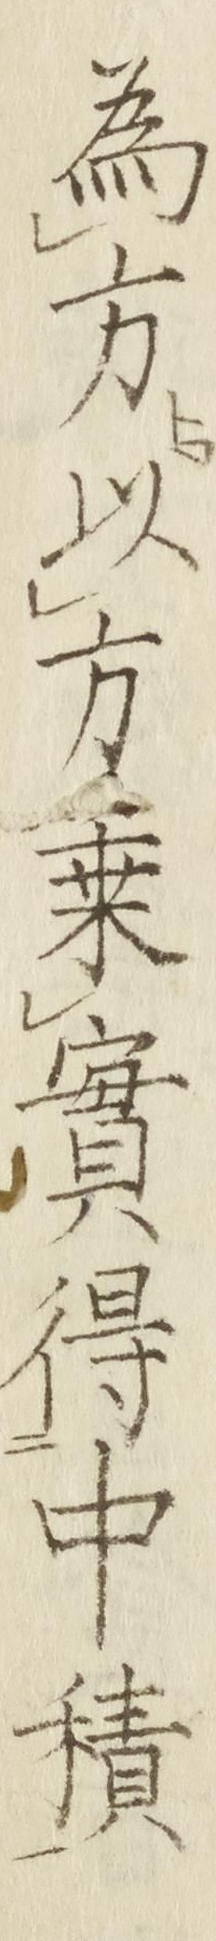為方。以方乗実得中積
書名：日食度
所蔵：東京大学地震研究所図書室 Earthquake Research Institute Library, The University of Tokyo, JAPAN
